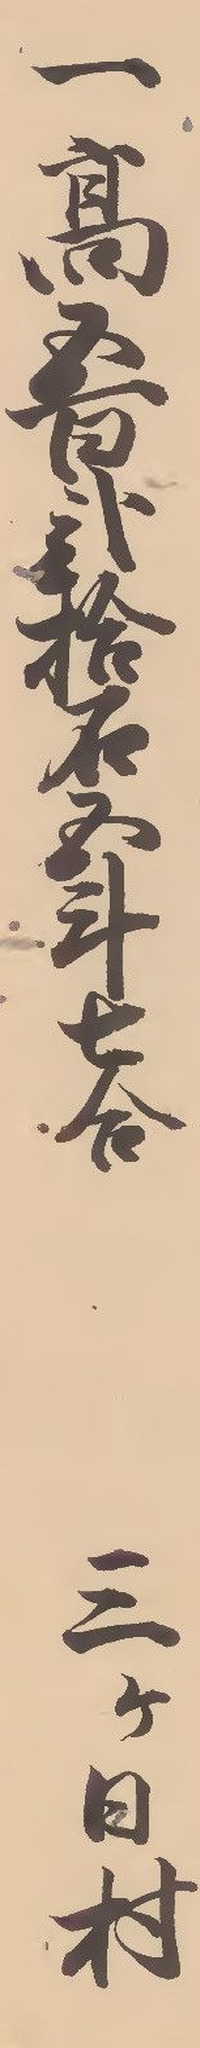一高五百弐拾石五斗七合三ヶ日村

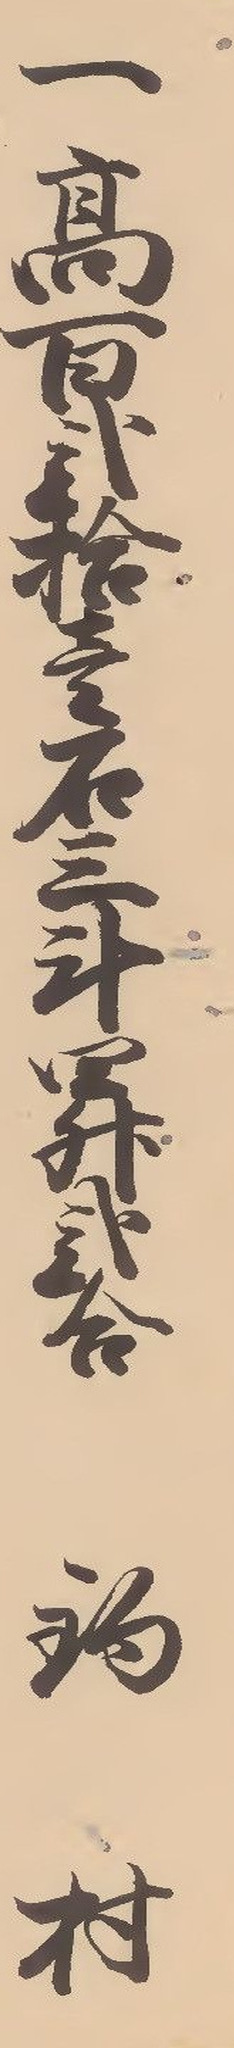一高百弐拾壱石三斗四升弐合釣村
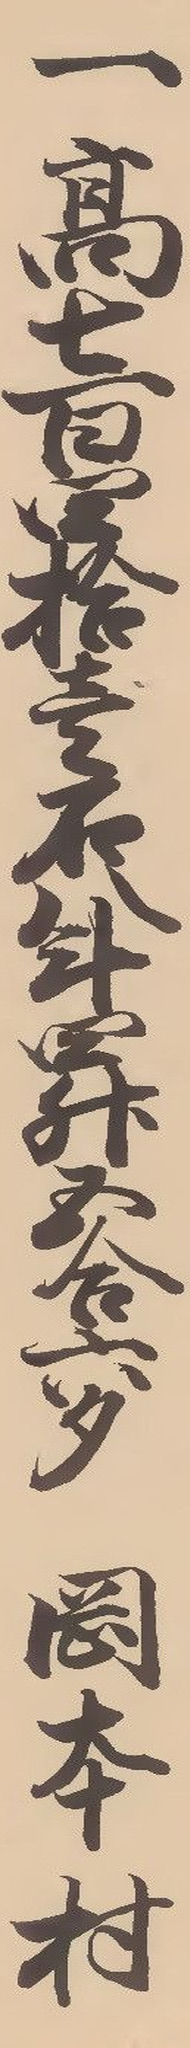一高七百四拾壱石八斗四升五合六勺岡本村
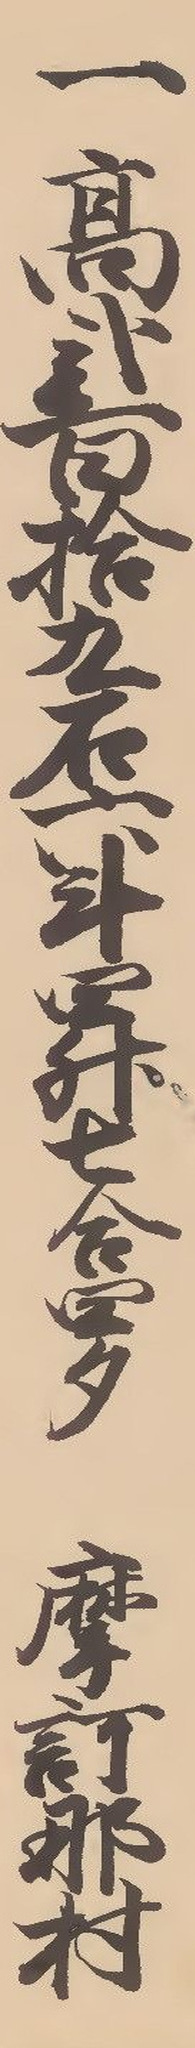一高弐百拾九石六斗四升七合四勺摩訶耶村
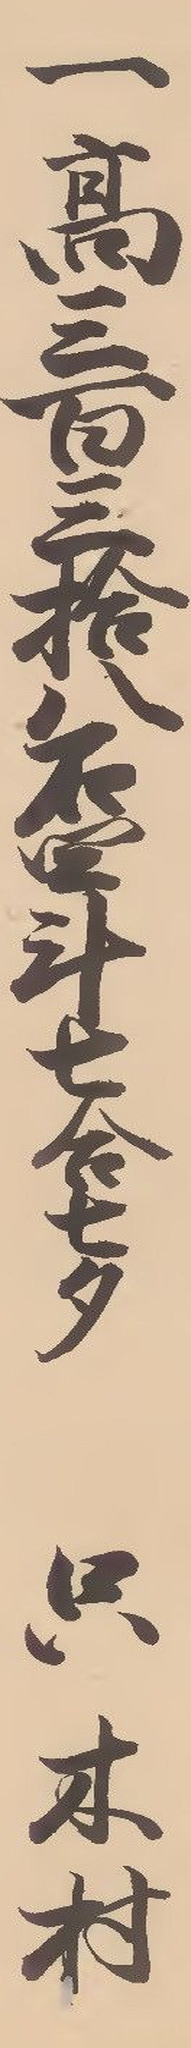一高三百三拾八石四斗七合七勺只木村
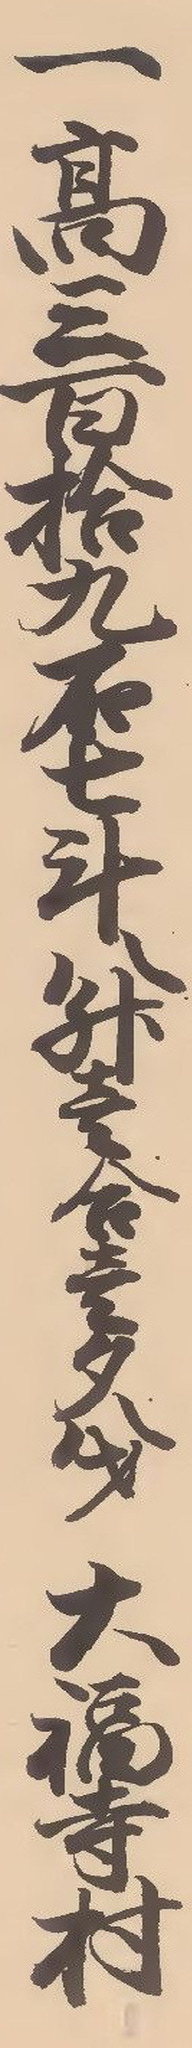一高三百拾九石七斗八升壱合壱勺八才大福寺村
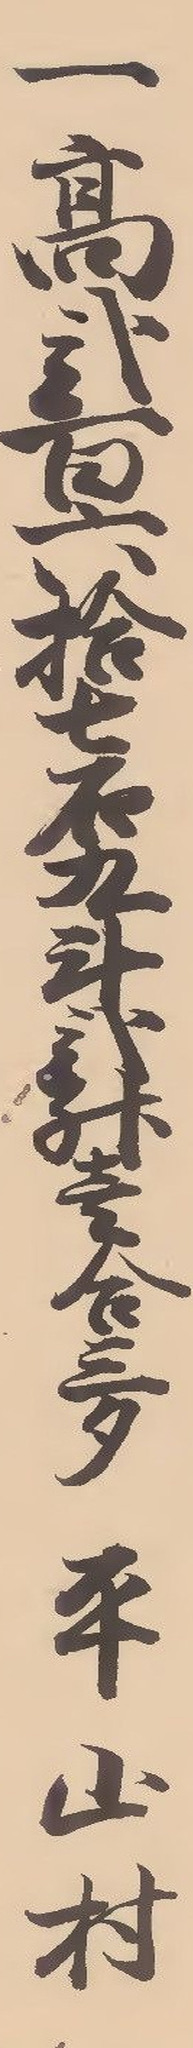一高弐百六拾七石九斗弐升壱合三勺平山村
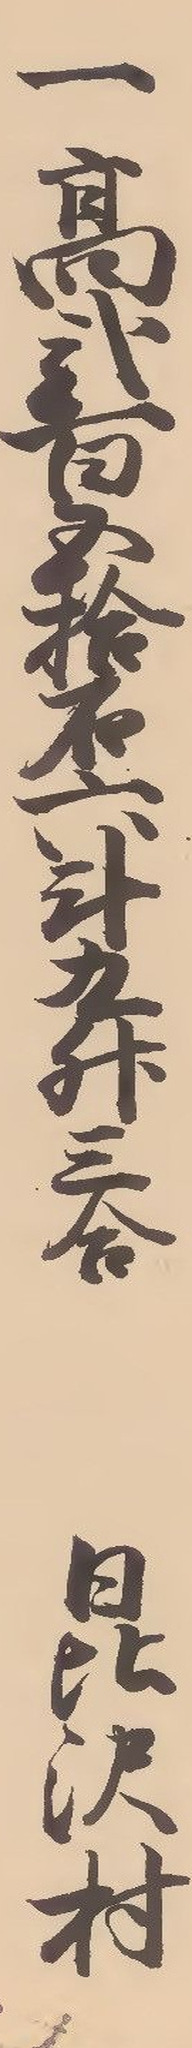一高弐百五拾石六斗九升三合日比沢村
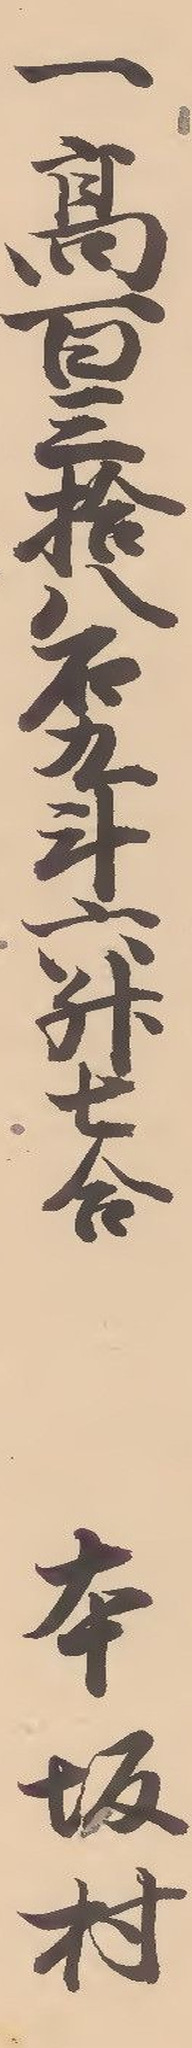一高百三拾八石九斗六升七合本坂村

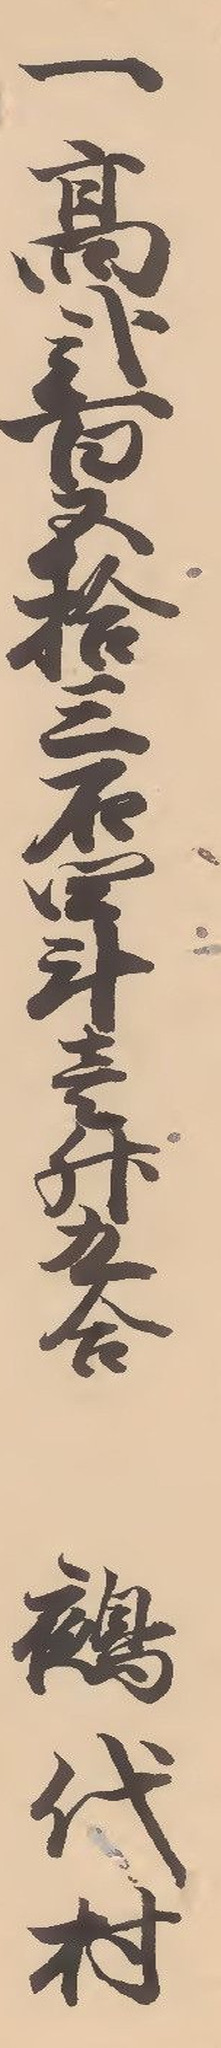一高弐百五拾三石四斗壱升九合鵺代村
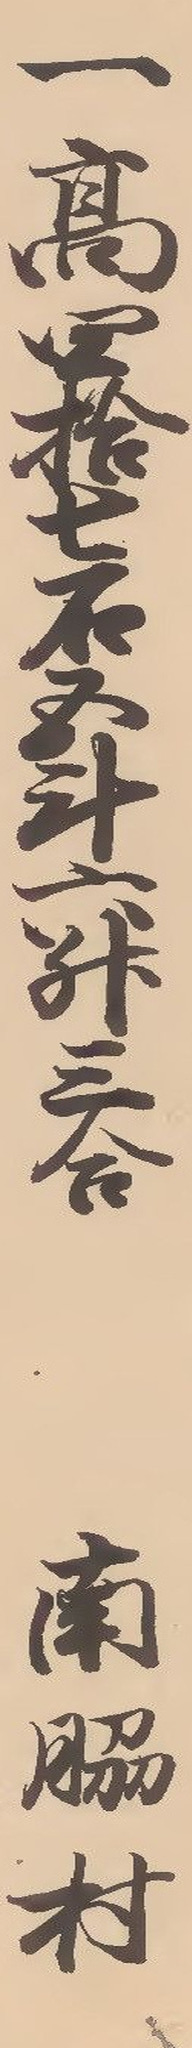一高四拾七石五斗六升三合南脇村
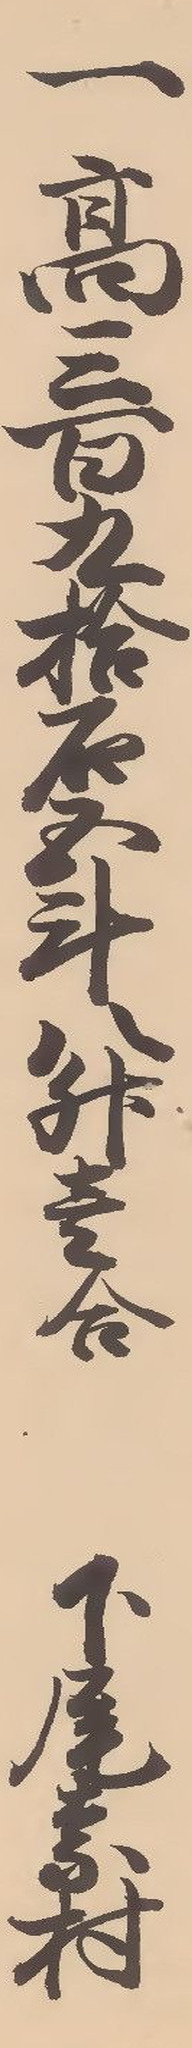一高三百九拾石五斗八升壱合下尾奈村
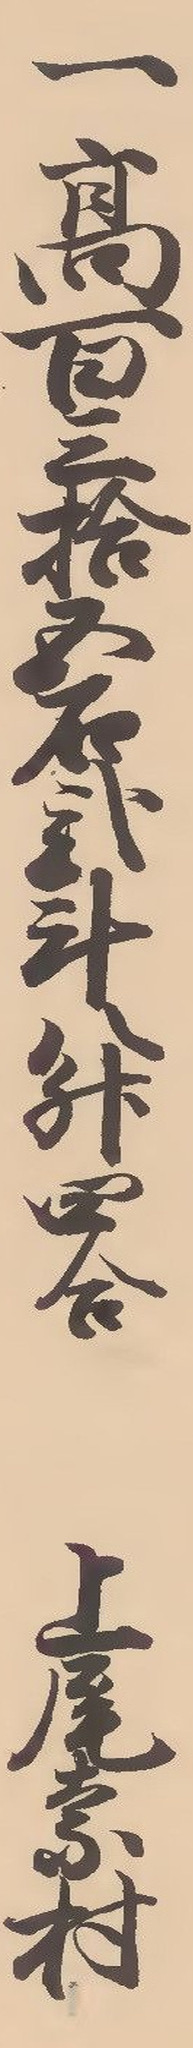一高百三拾五石弐斗八升四合上尾奈村
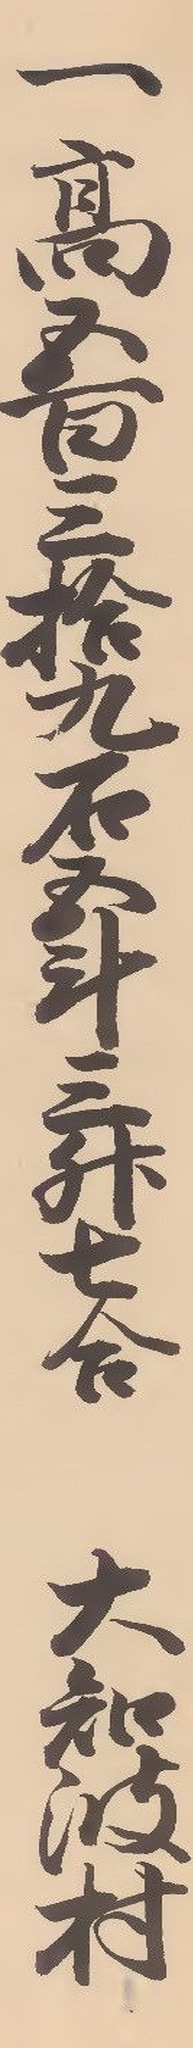一高五百三拾九石五斗三升七合大知波村
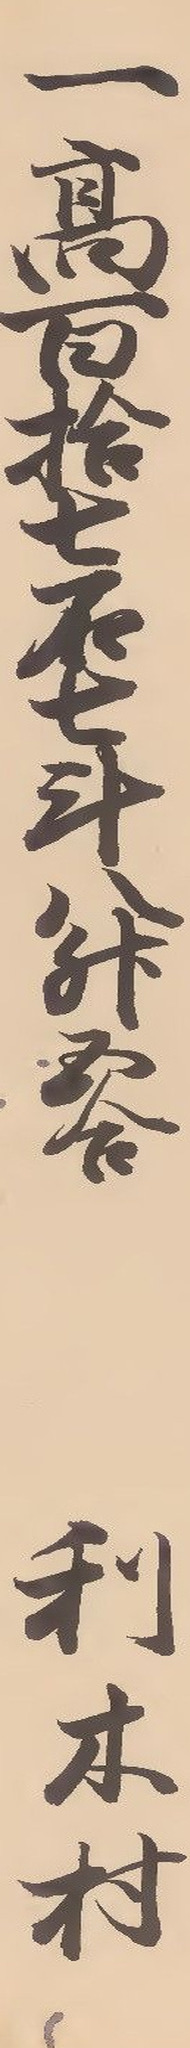一高百拾七石七斗八升五合利木村
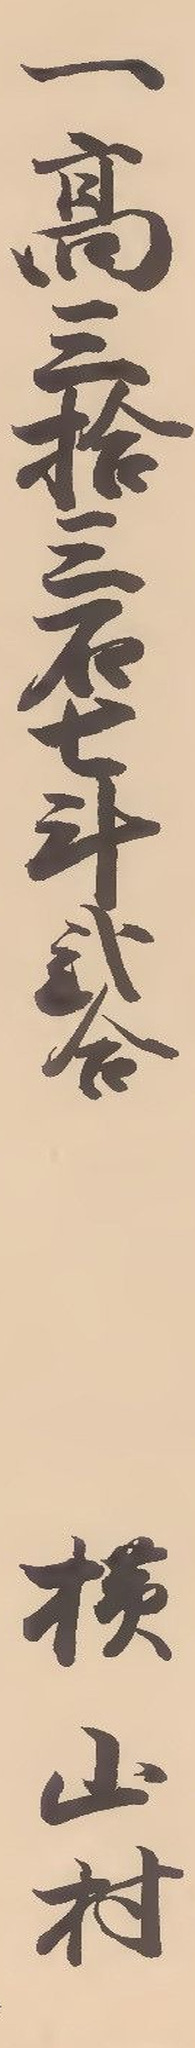一高三拾三石七斗弐合横山村
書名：遠江国郷帳
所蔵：国立公文書館 National Archives of Japan
